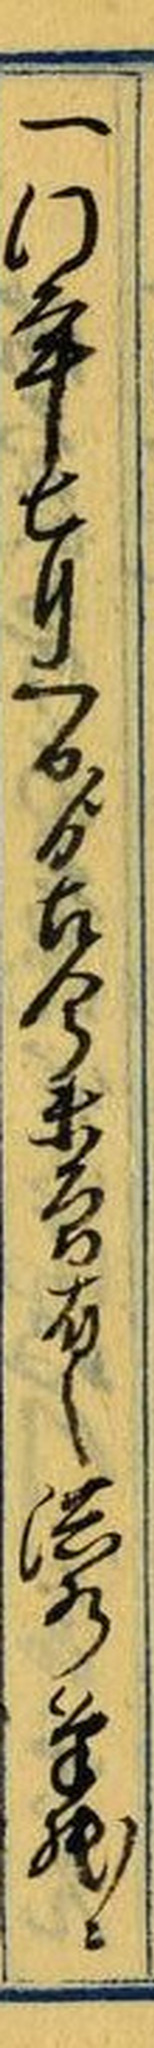一同年七月一日ゟ古今未曾有之洪水筆紙に
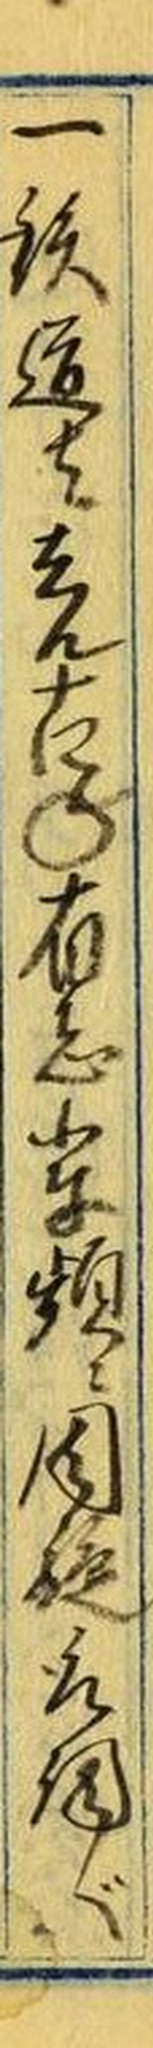一鉄道は去る十四年有志輩頻に周旋取調べ
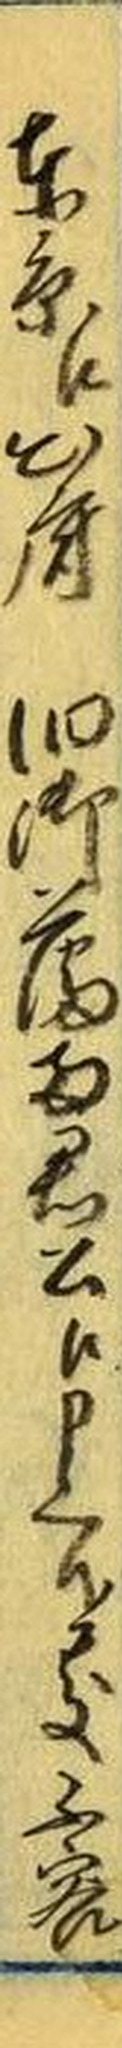東京え出府旧御藩両君公え申上候処不容
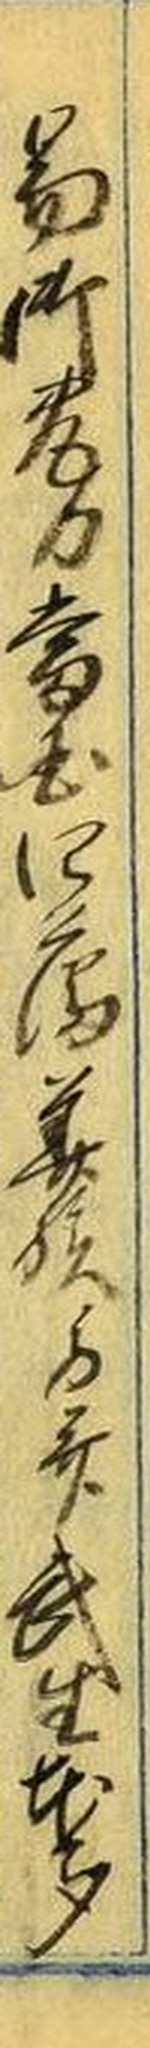易御尽力当国四藩華族方并武生本多
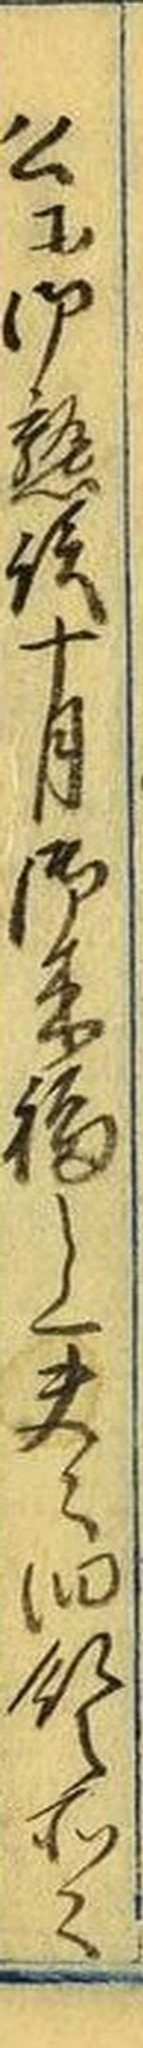公も御熟談十月御来福之上夫々旧領之所々
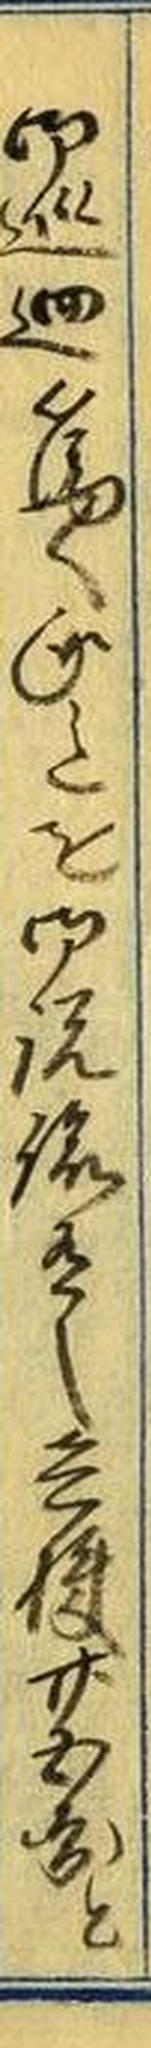御巡廻篤く趣意を御説諭有之壱株廿五円と
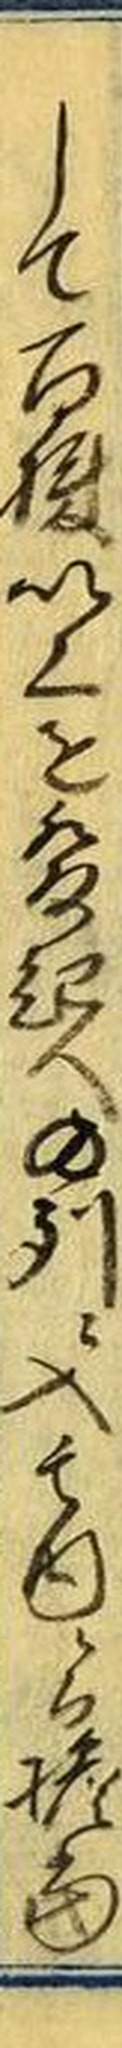して百株以上を発起人の列に入其内に而担当
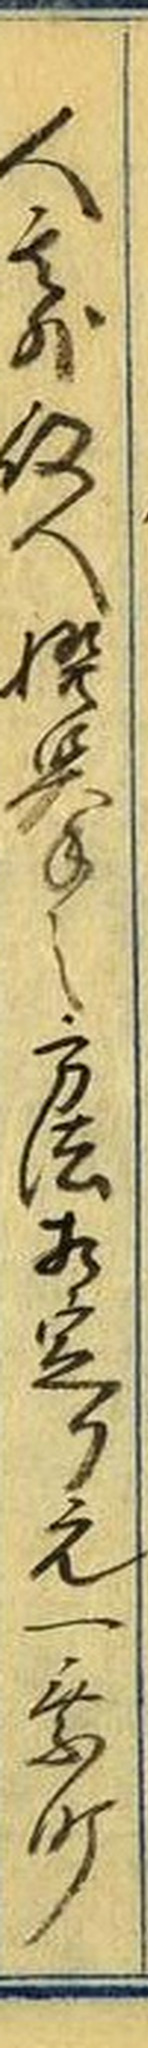人其外役人撰挙之方法相定り元一乗町
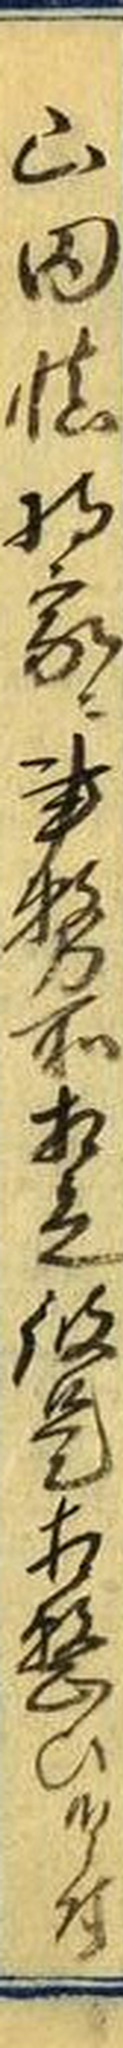山田慎持家に事務所相立彼是相整ひ候に付
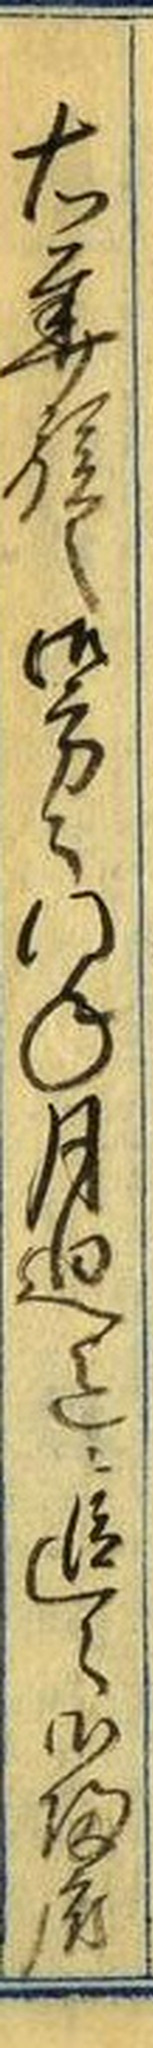右華族之御方々同年月廻迄に追々御帰府

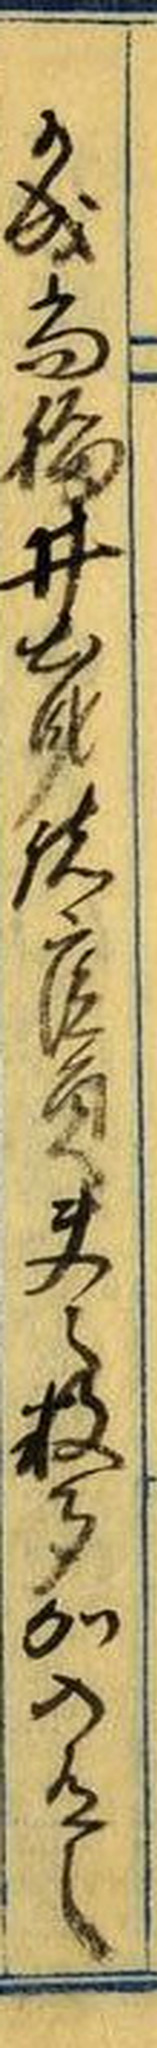相成尚福井出身諸官員夫々数多加入有之
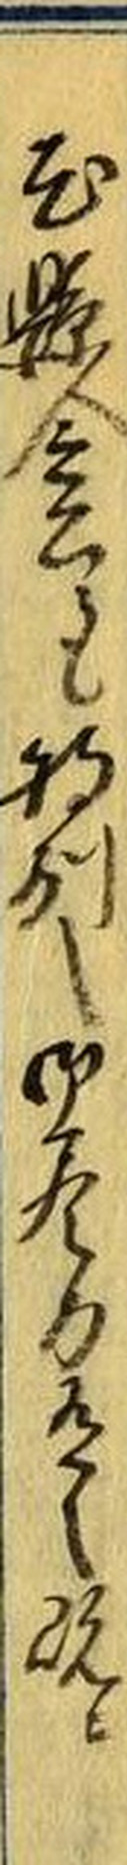尤県人会にも特別之御尽力有之既に
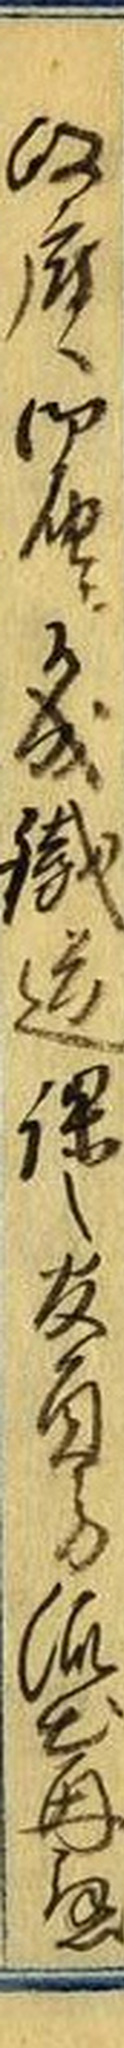政府へ御届に相成鉄道課之官員方流出再懸
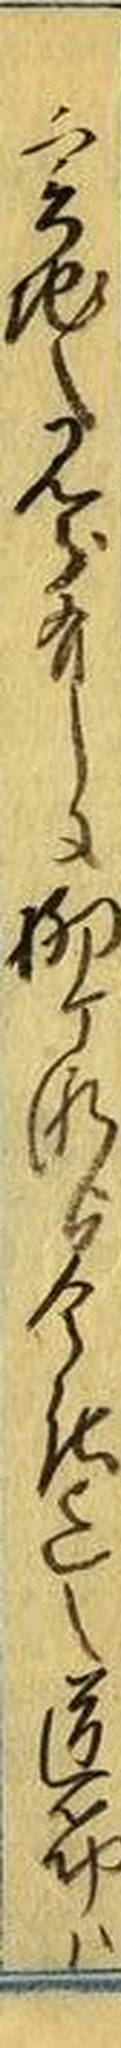実地之見分有しに柳ヶ瀬ゟ今庄迄之道筋は
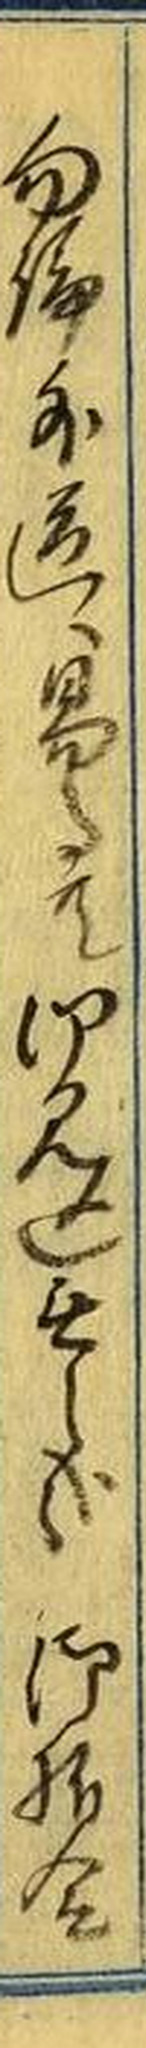勿論外道へ易る共御見込無之哉御指合
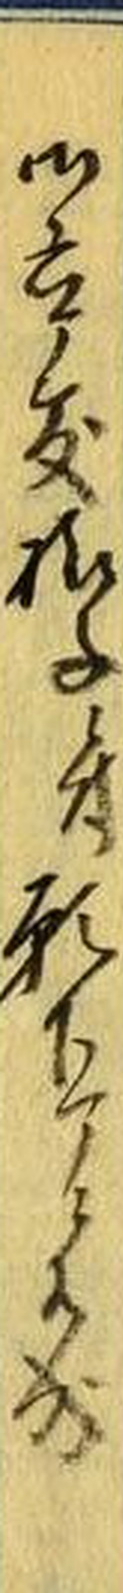御六ヶ敷様子に付願下ヶに相成
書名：温古集 五巻
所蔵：福井県文書館 Fukui Prefectural Archives
